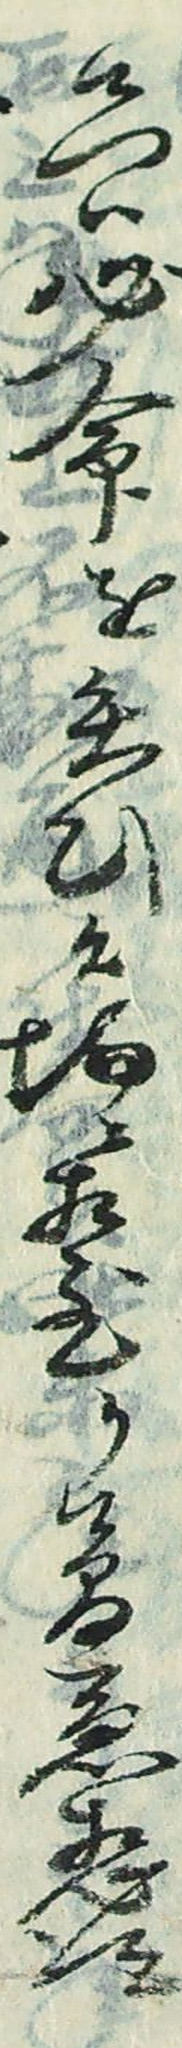候へハ必命を失ひ候場ニ相至り候間兼相心得
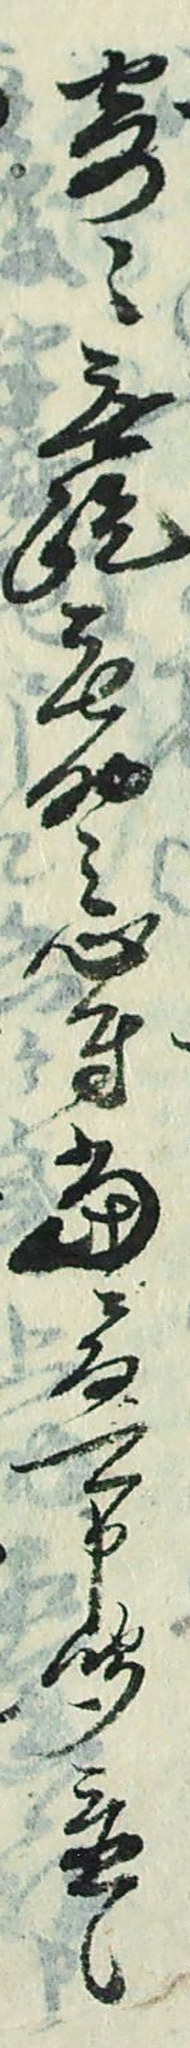寄々無屹庄助之心付當ニ而可申聞置候
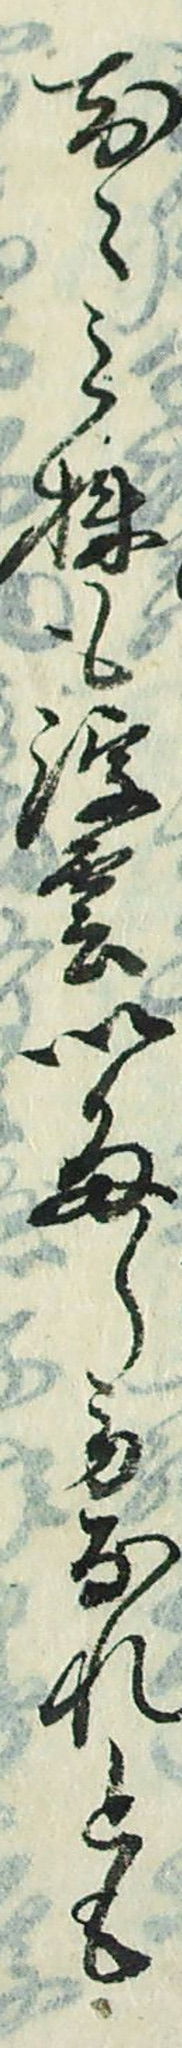前々之株も浮雲いたし方なれとも
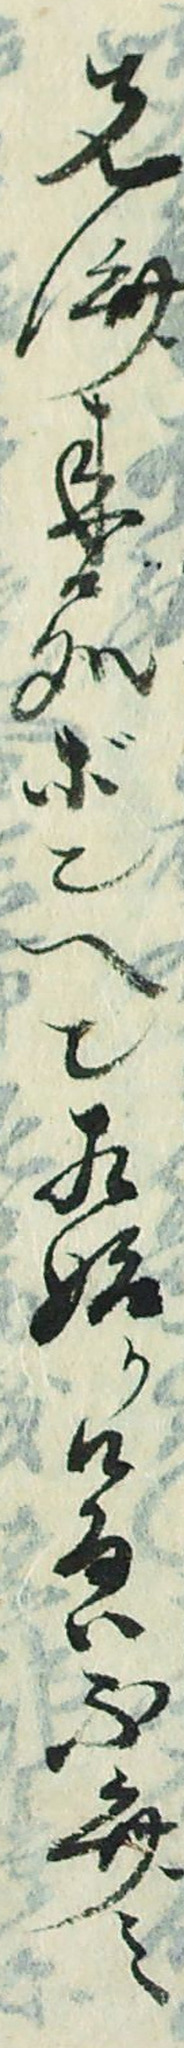先済来候処ボンヘン相始り候而ハ不弁之

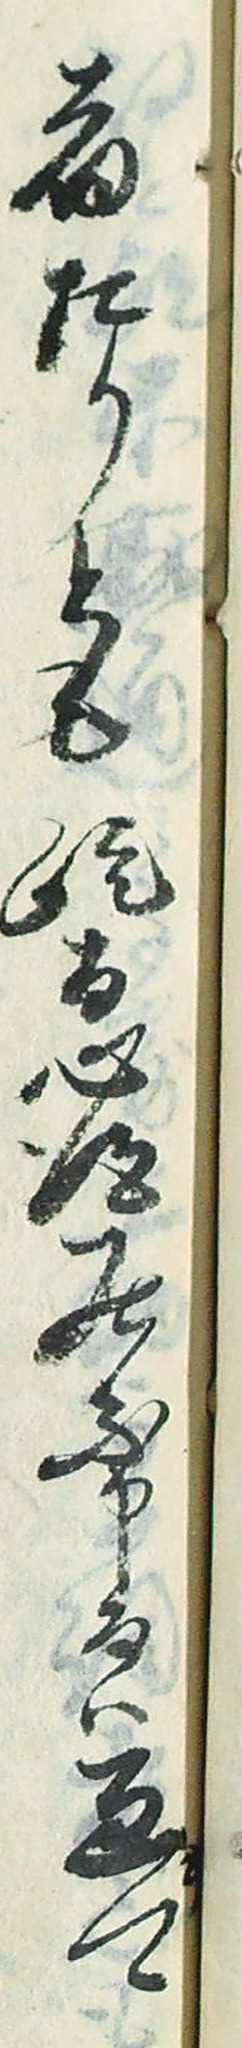者たりとも屹と心得居不申而ハ過可
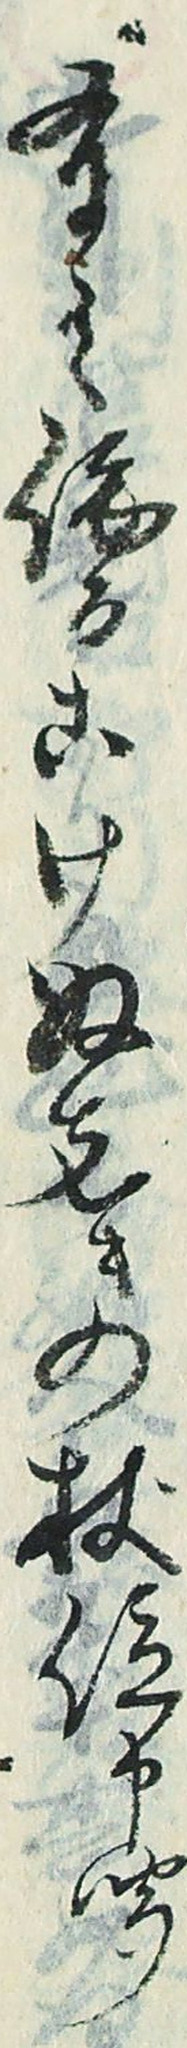有之候依而こけぬ先キの杖位申聞
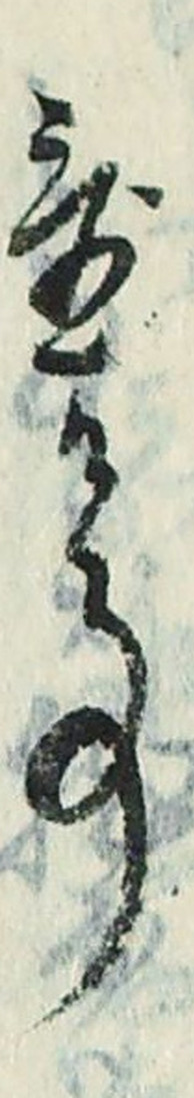置候事
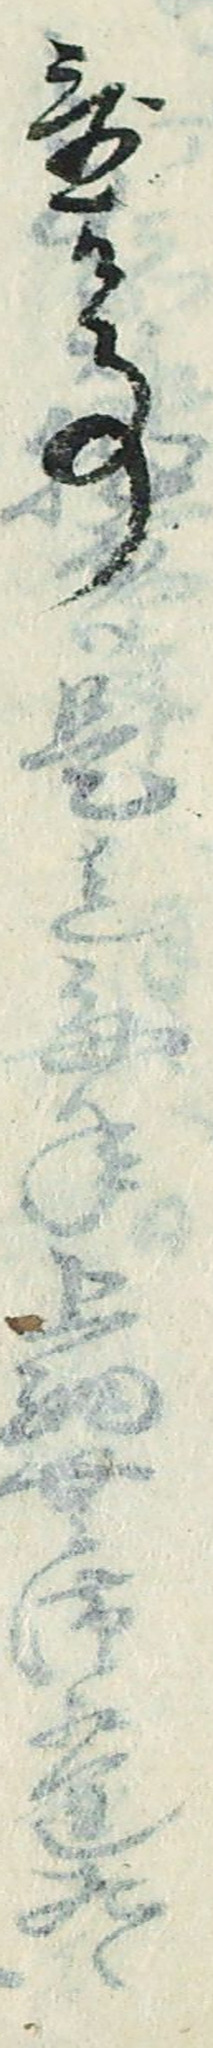置候事
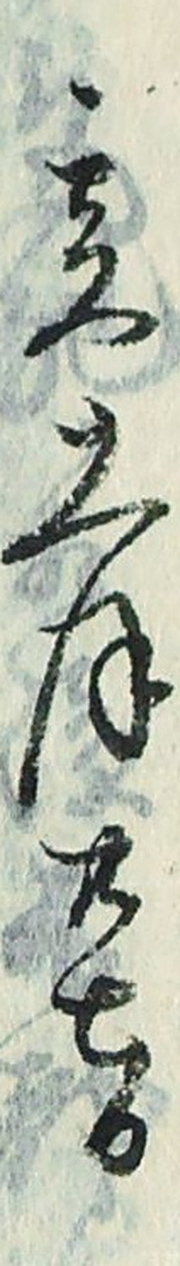亥十一月廿七日
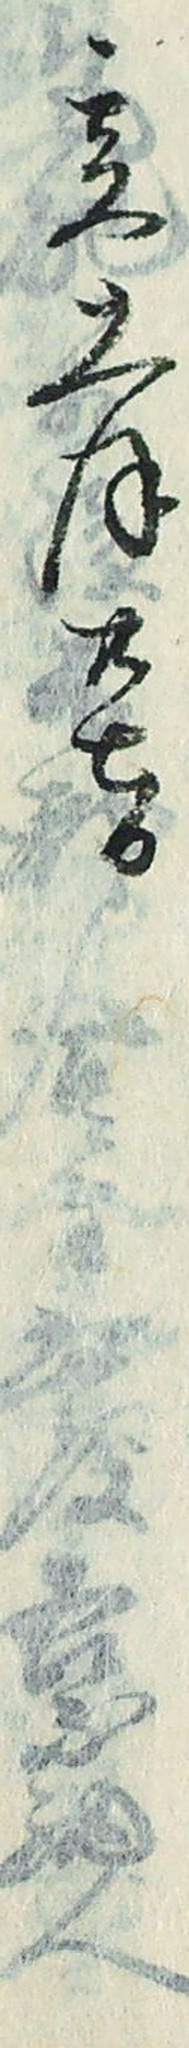亥十一月廿七日
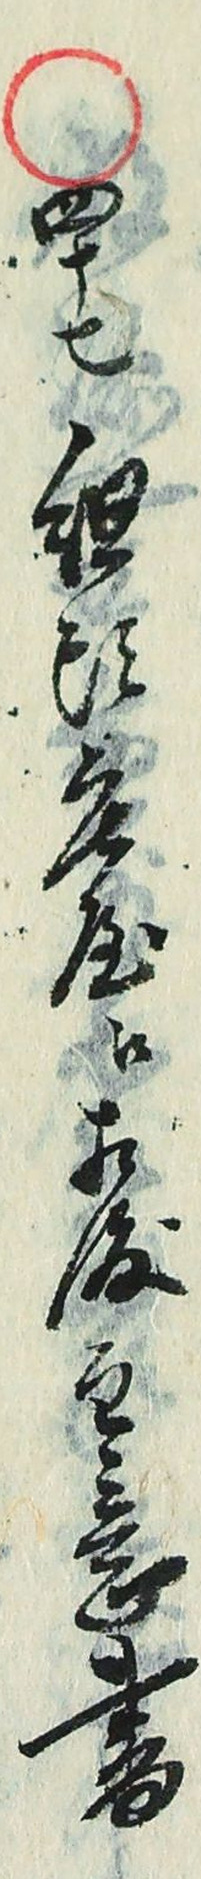○四十七組頭庄屋江相渡主意書
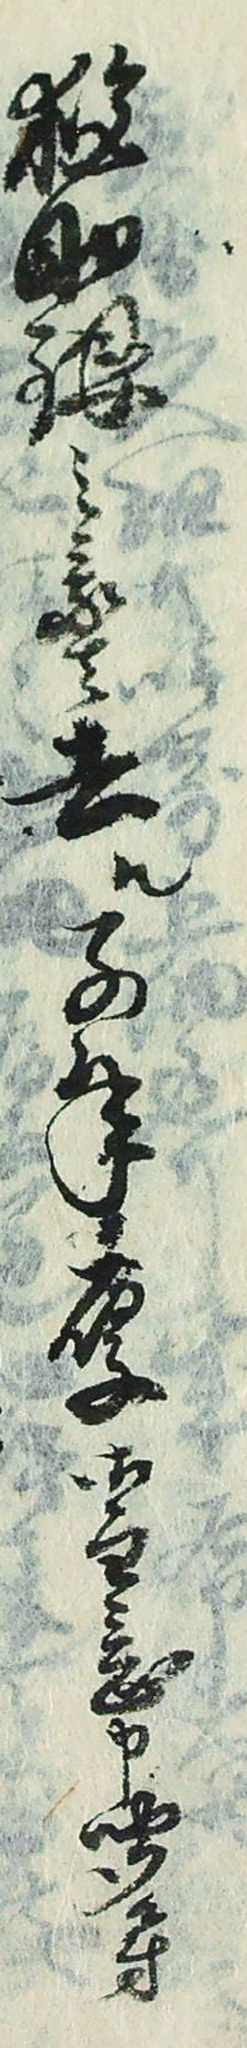救助銀之義者去ル子年ニ厚御主意申聞ニ付
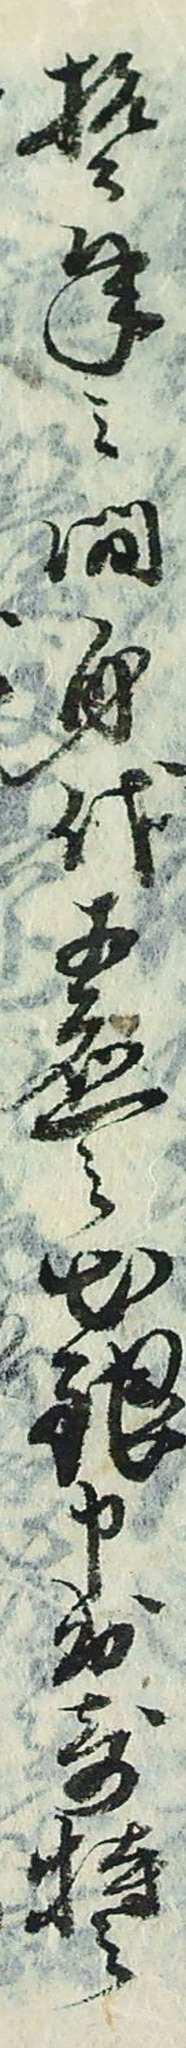拾ケ年之間身代相應之出銀申出寄持之
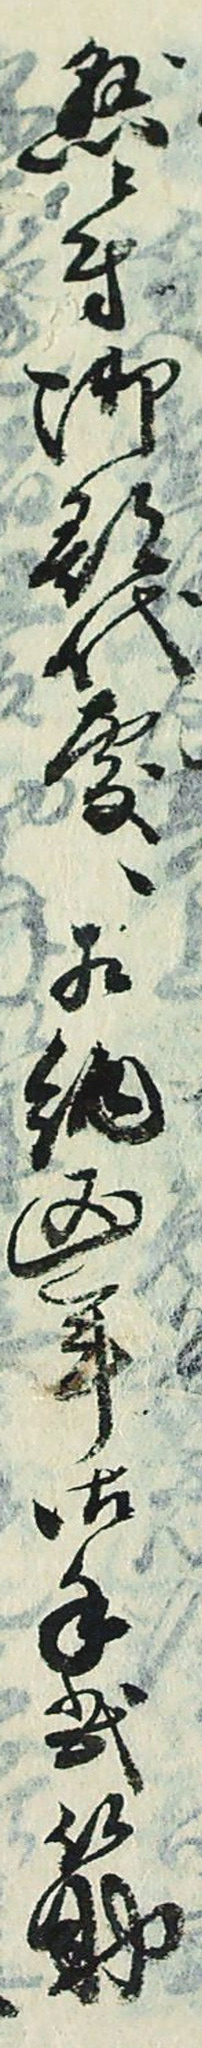懸ニ付御郡代處へ相納凶年御手當筋
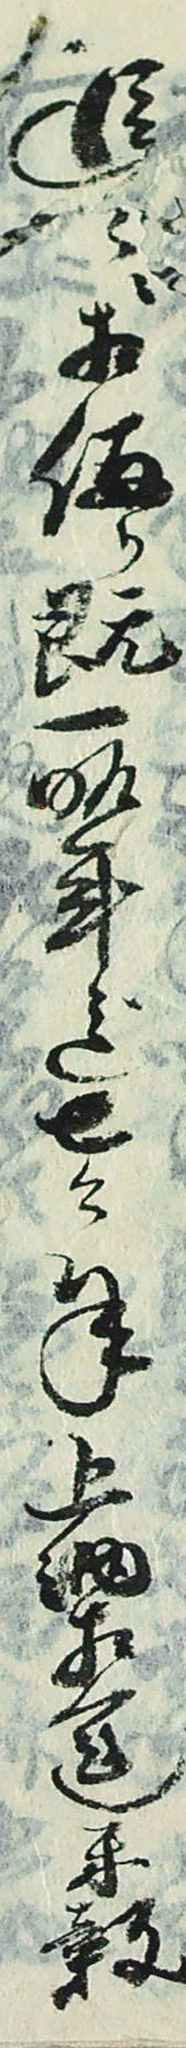追々相備り既一昨年迄七ケ年上納相運米穀
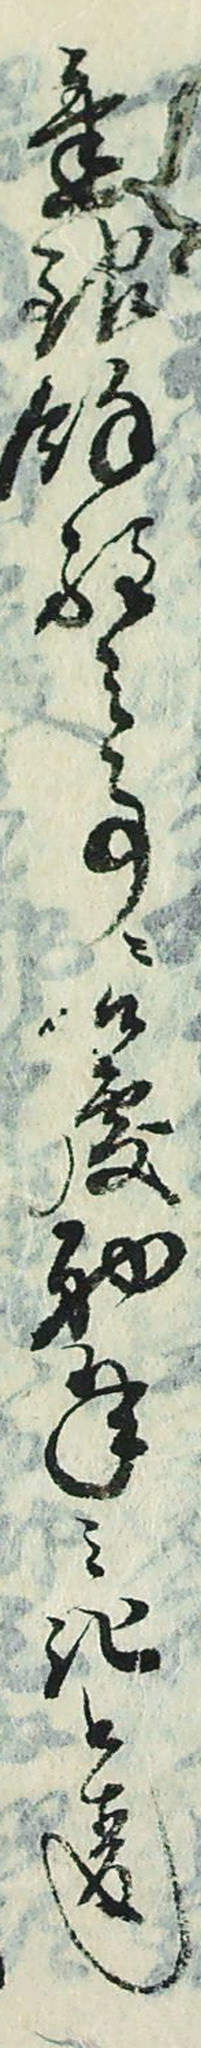金銀餘程之事ニ候處初年之比と違
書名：諸御趣意書并御下知向之写
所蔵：鳴門教育大学 Naruto University of Education
